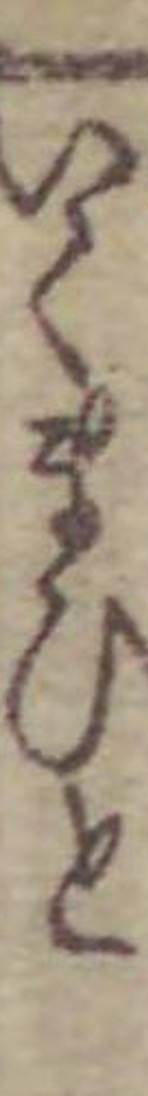いくまひと
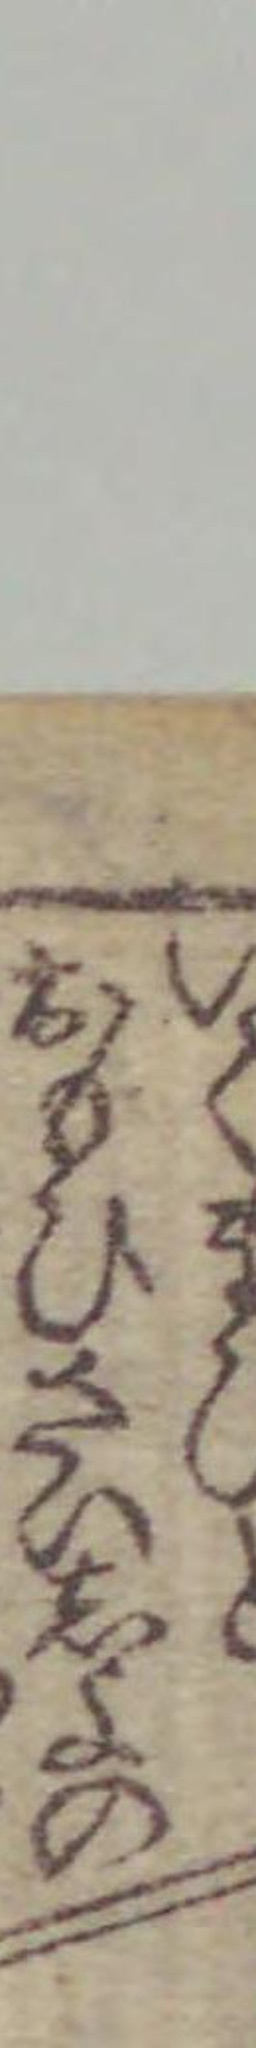おもひさいしよの
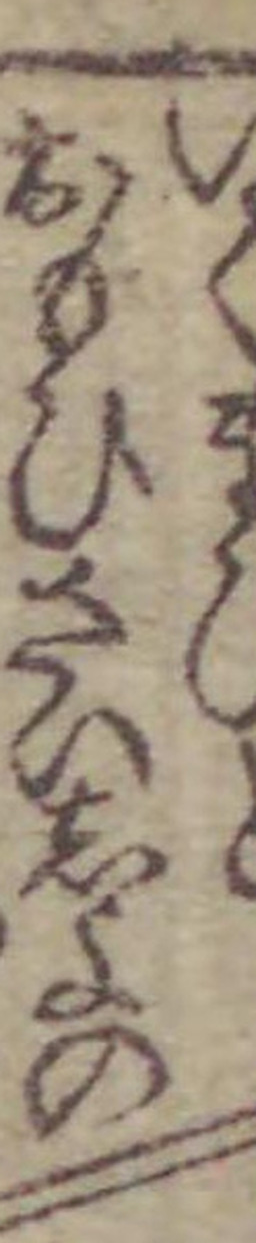おもひさいしよの
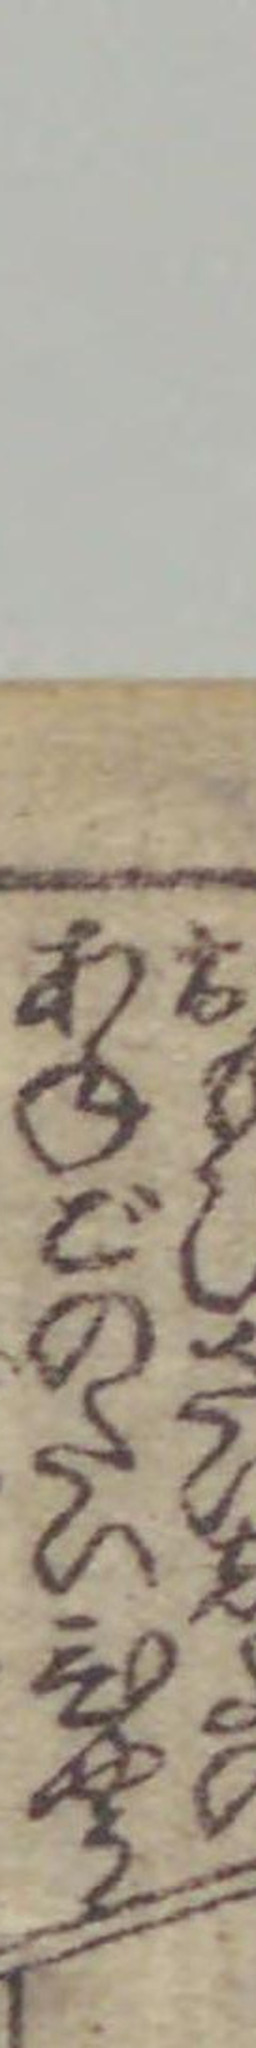あねごのたいひやう
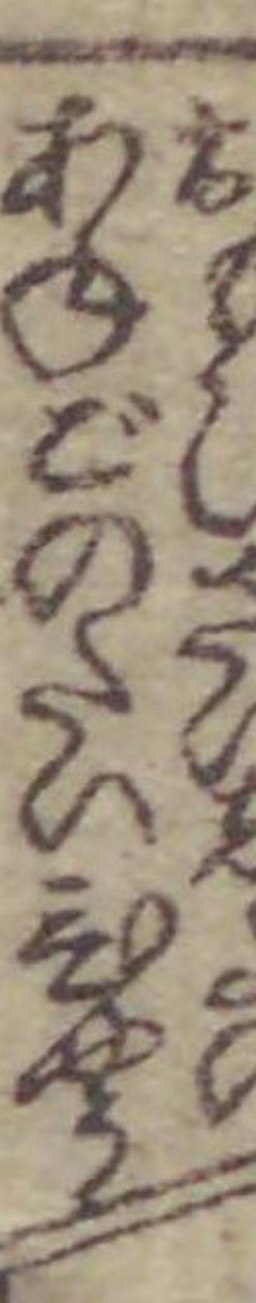あねごのたいひやう
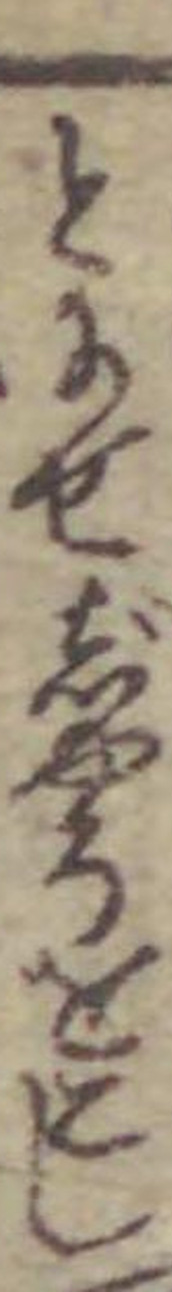とにせじやうをこし
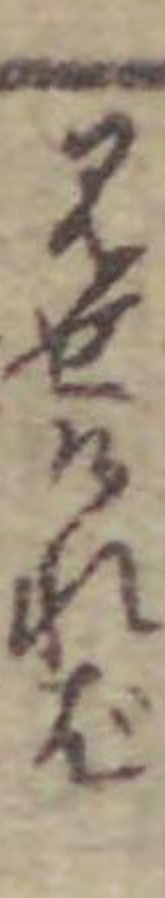見せければ
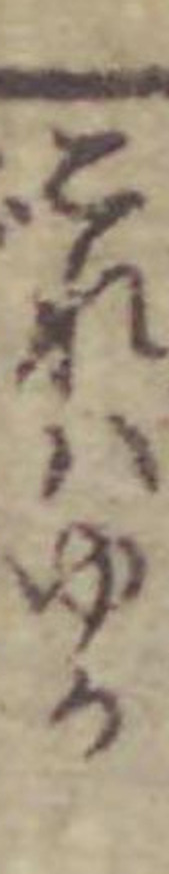これはゆか
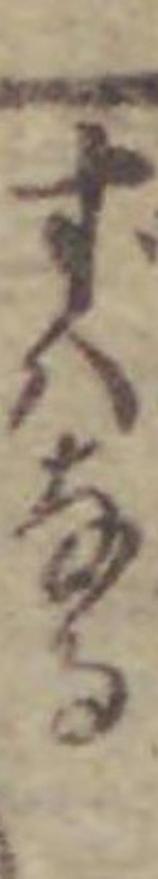ずはなる
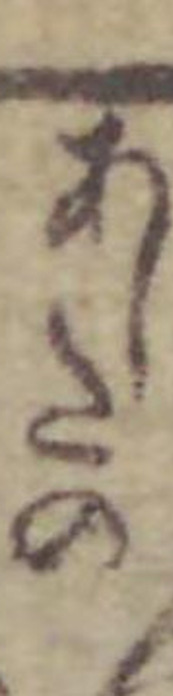あしたの
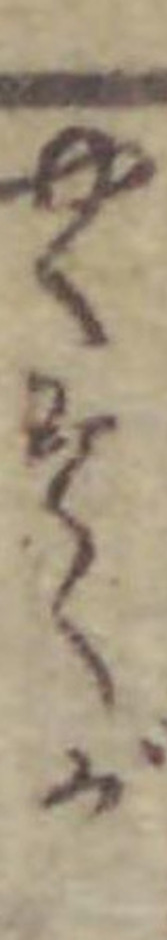やくそくが
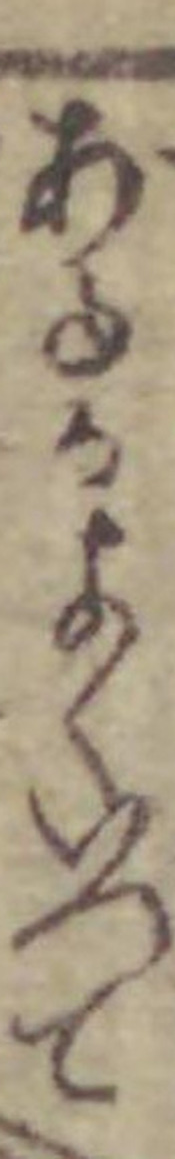あるかよくいつて
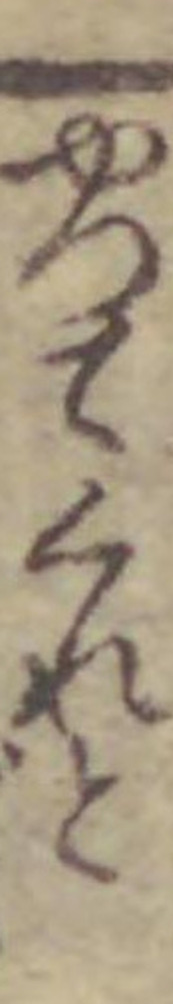やつてくれと
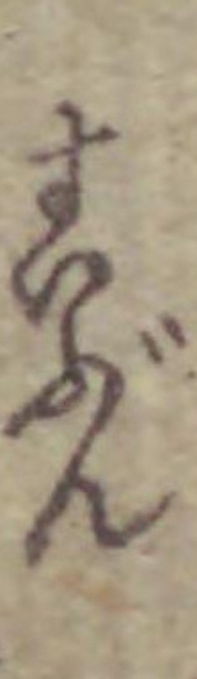ずいぶん
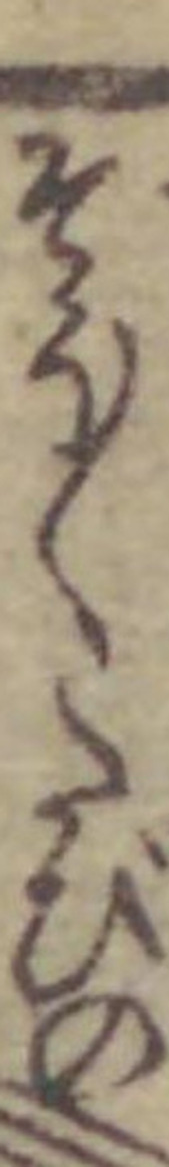そう〳〵たびの
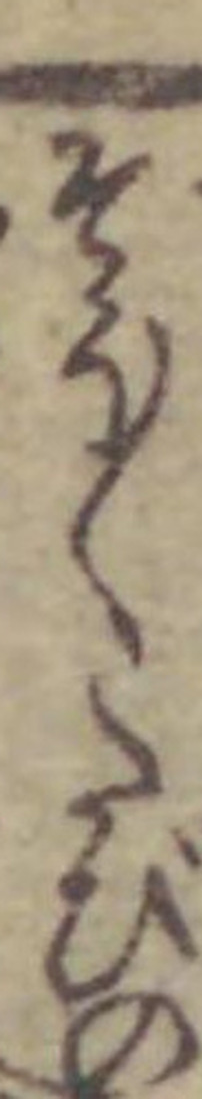そう〳〵たびの
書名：親父布子鳶握 3巻
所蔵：国立国会図書館 National Diet Library, JAPAN
